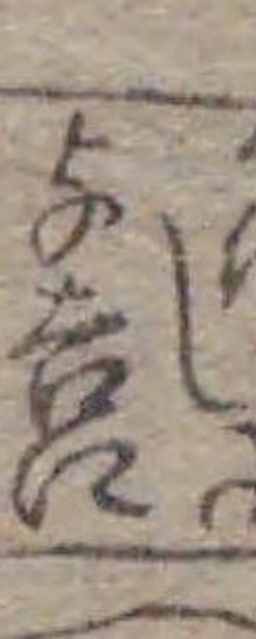与吉に
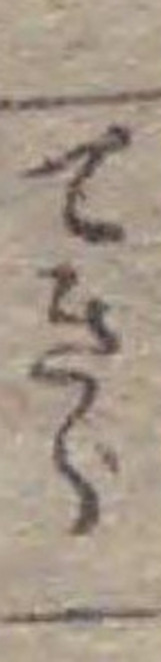てきら
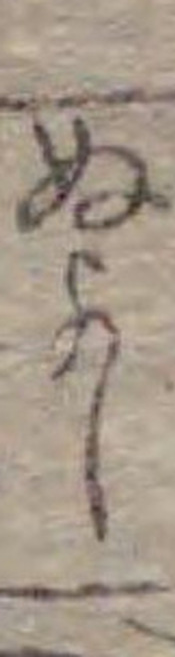ぬよし
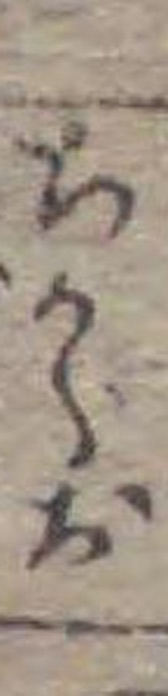ちからお
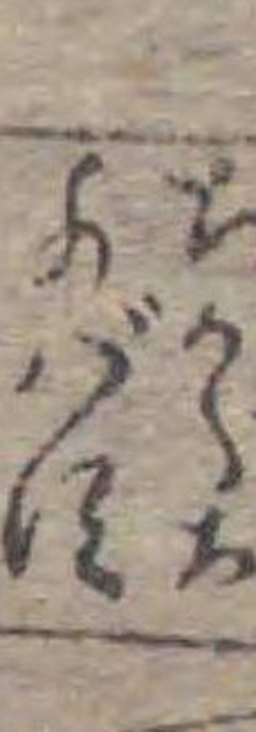よばす
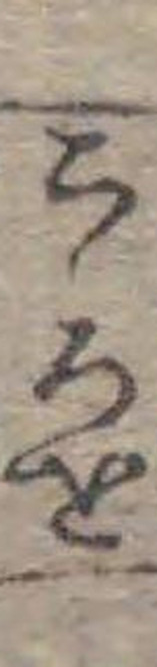こゝろを
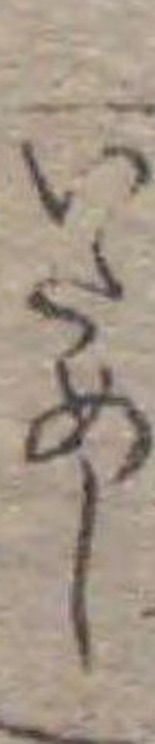いためし
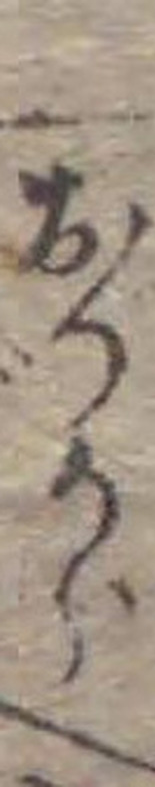おりから
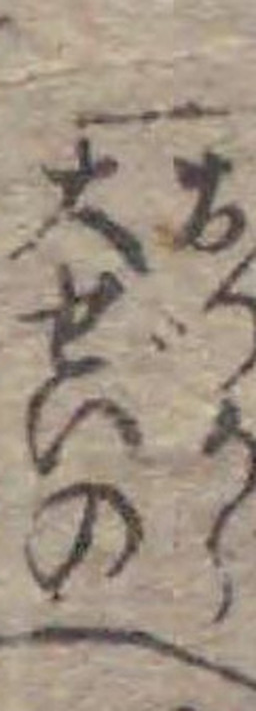大ぜいの
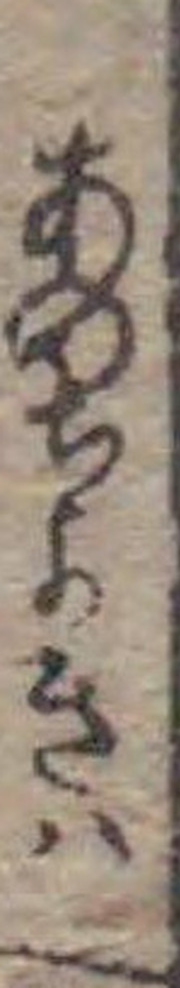あのちよきは
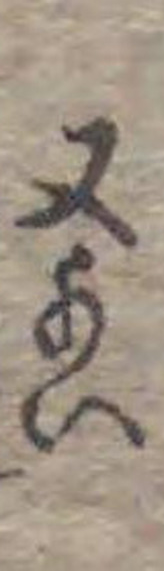又よい
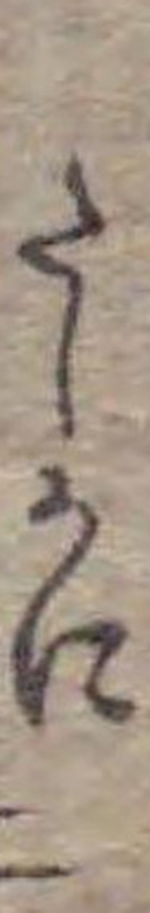たしかに
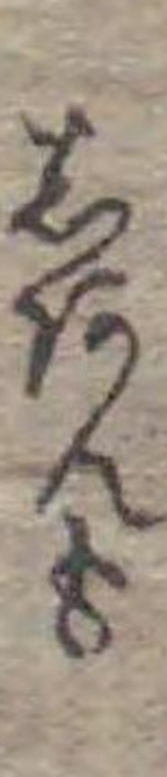しあんも
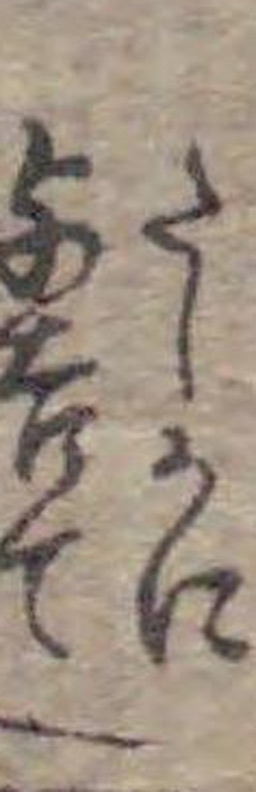与吉て
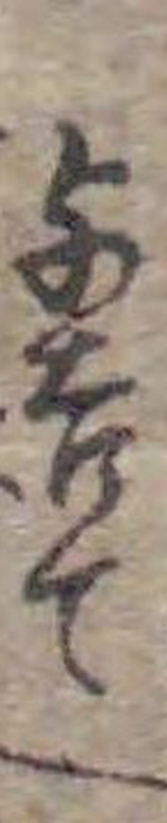与吉て
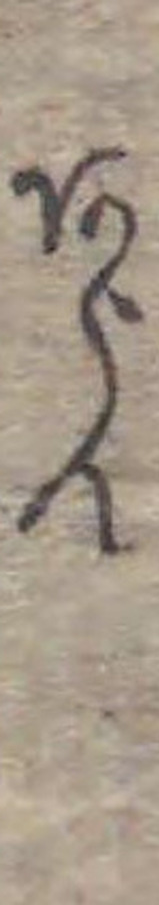あらん
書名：神田与吉一代記 : 3巻
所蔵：国立国会図書館 National Diet Library, JAPAN
